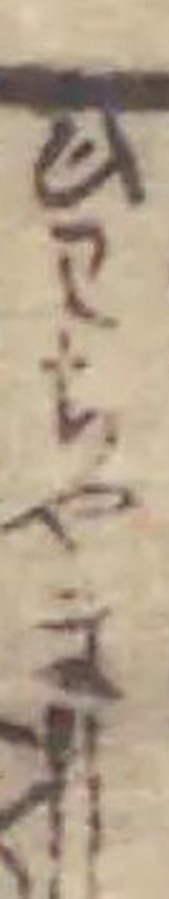ひわちやま
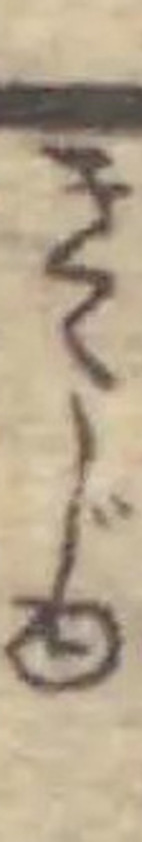きくじゆ
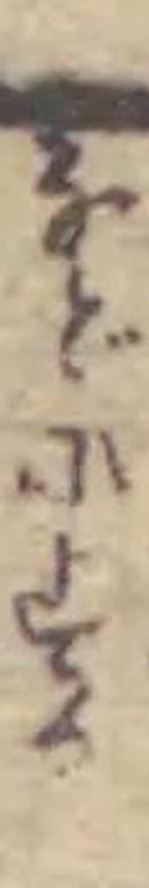などにする
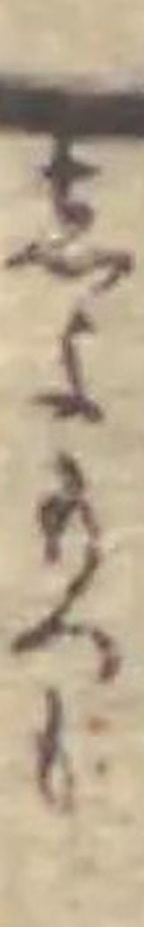しよもつも
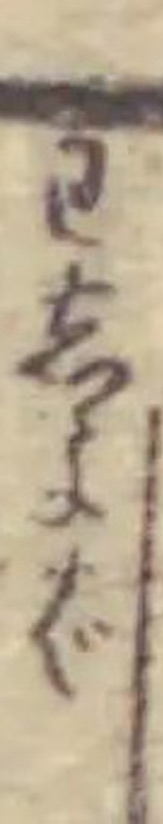わしよば
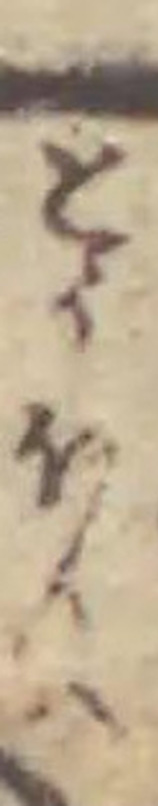とうほんは
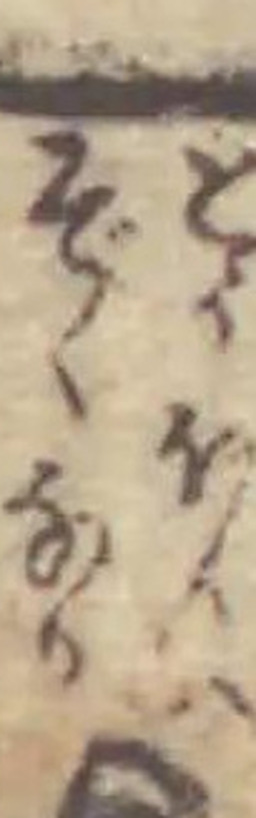ぞくなり
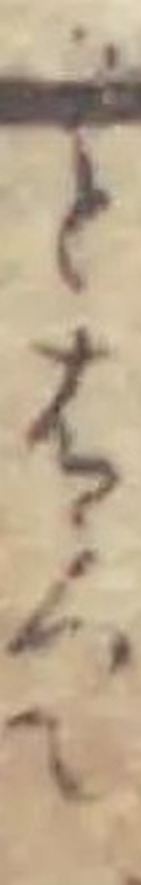とはらつて
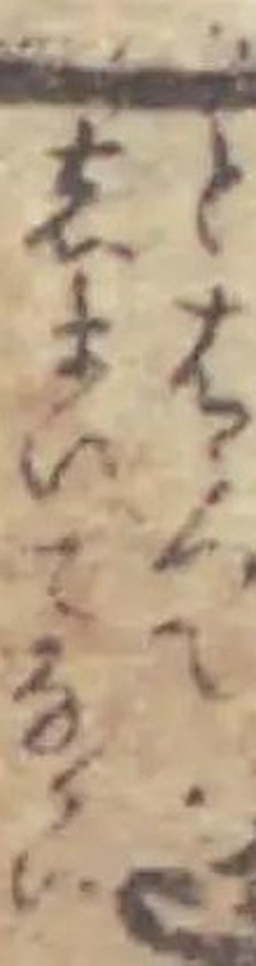しまいてならい
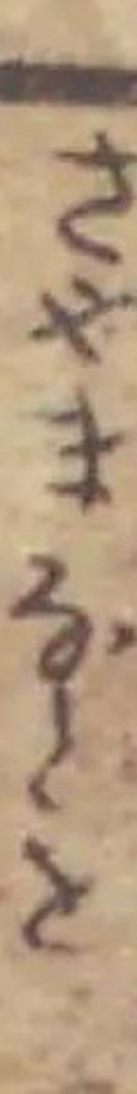さやまなどを
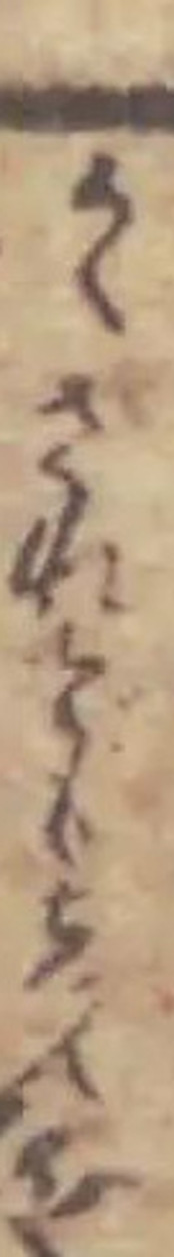かくされどもしん
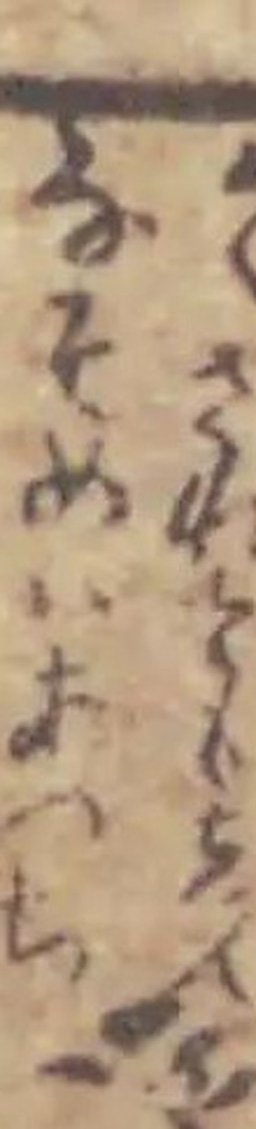なそめはあつち
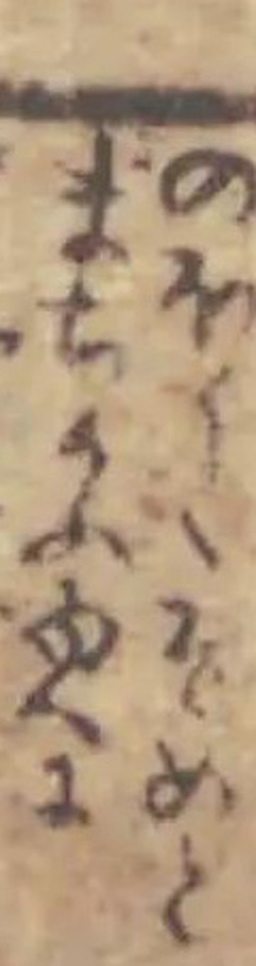まちかふゆへに
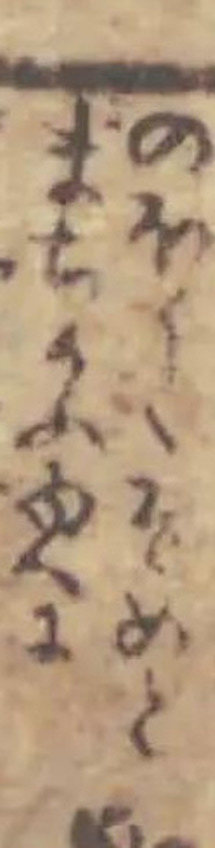まちかふゆへに
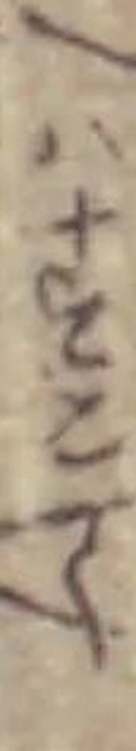はすこく
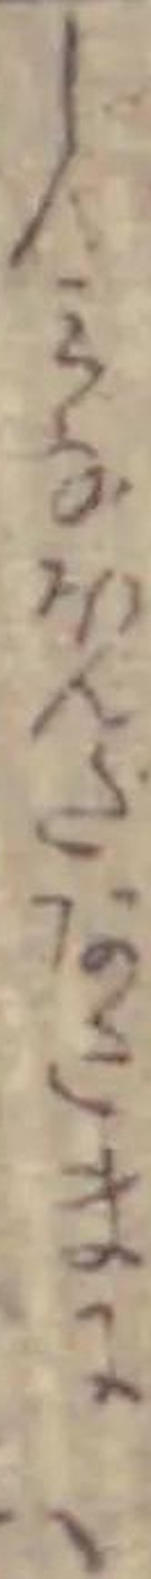しんみなほんだあたまに
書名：茶羅毛通人 3巻
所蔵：国立国会図書館 National Diet Library, JAPAN
